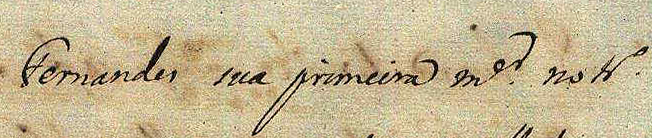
Fernandes sua primeira m.er no tr.o
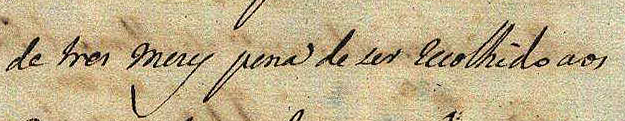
de tres mezes pena de ser recolhido aos
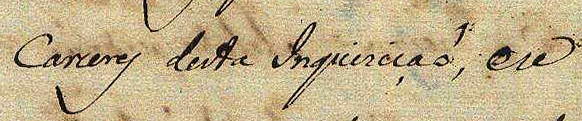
Carceres desta Inquiziçaõ, e se
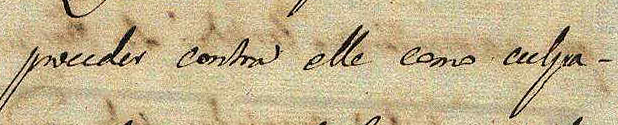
proceder contra elle como culpa
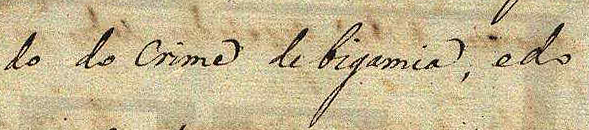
do do Crime de bigamia, e do
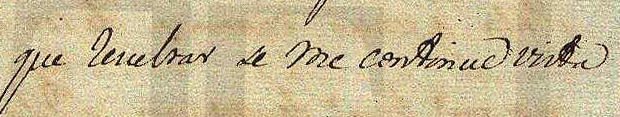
que Resultar se me continue vista
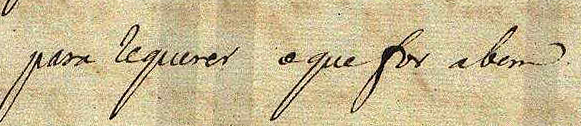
pura Requerer o que for a bem
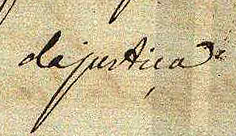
da justiça.
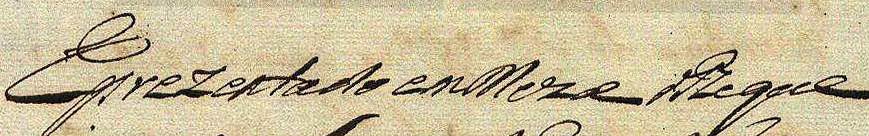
E prezentado em Meza o Reque
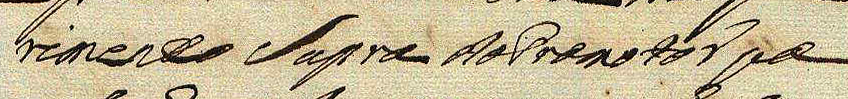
rimento Supra do Promotor pa
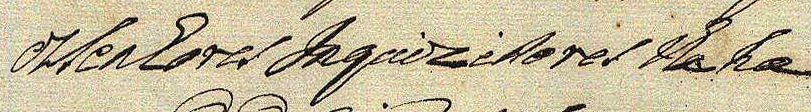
os senhores Inquizidores lhe ha
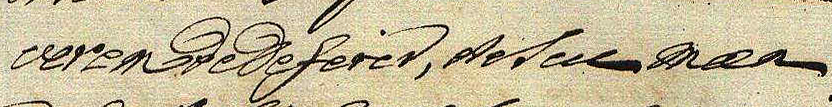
verem de Deferir, de seu man
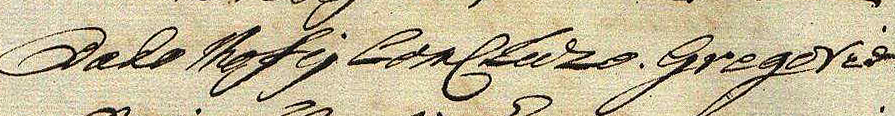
dado lhe fis ConCLuzo Gregorio
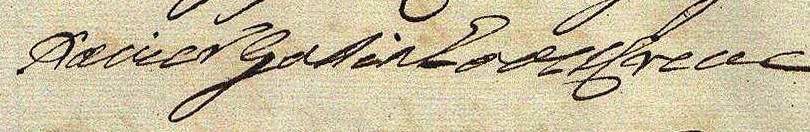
Xauier Godinho o esCreui
